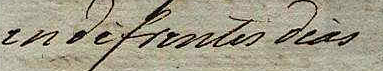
en difrentes dias.
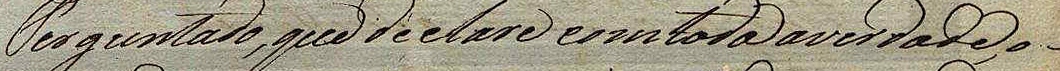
Perguntado, que declare com toda a verdade, o
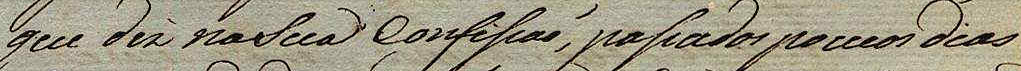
que diz na sua confissaõ, passados poucos dias
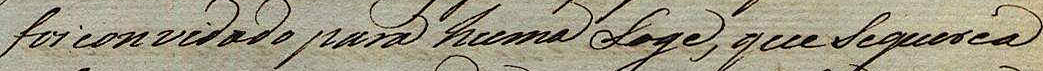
foi convidado para huma Loge, que se querea
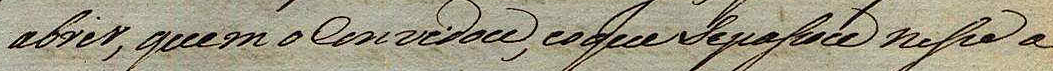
abrir, quem o convidou, e o que se passou nesse a
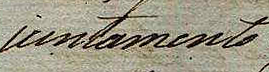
juntamento.
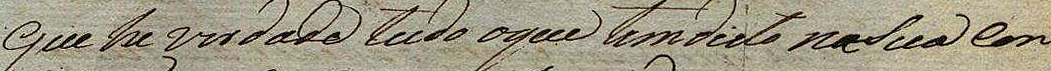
Que he verdade tudo o que tem dicto na sua con
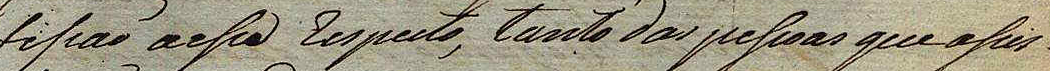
fissaõ a esse respecto, tanto das pessoas que assis
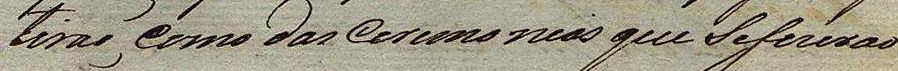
tiraõ, como das cerimónias que se fezeraõ
